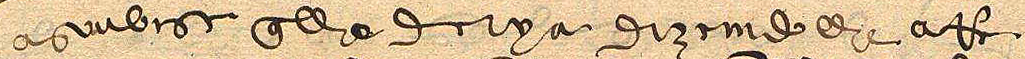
a soubese q̄ lhe derya dizemdo lhe a Re
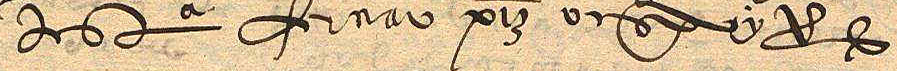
testa fernao pīz o esp̄vy
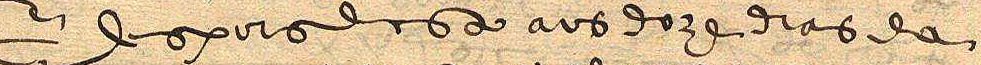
E despois desto aos doze dias da
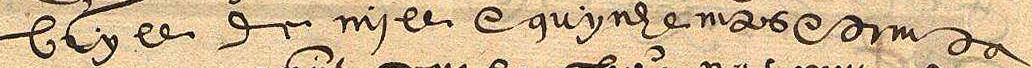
bryll de mjll e quyhemtos e trinta
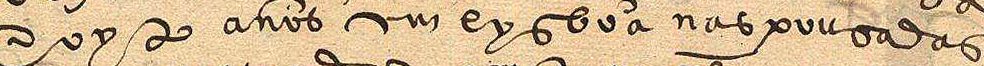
e oyto anōs em lysboā nas pousadas
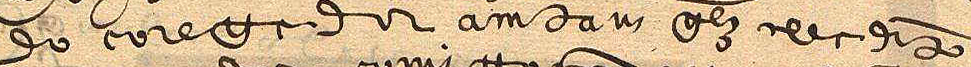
do coregedor amtam ḡlz elle dito
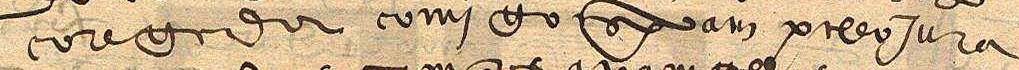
coregedor comjgo esp̄vam pello Jura
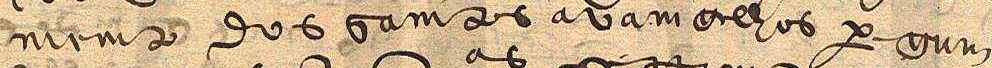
memto dos samtos avamgelhos ꝑegum
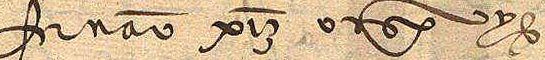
fernão pīz o esp̄vy
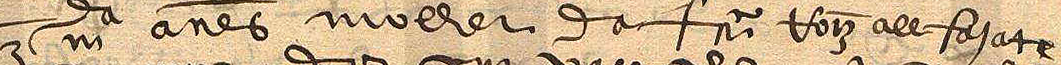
item mda an̄es molher da frço Roīz allfajate
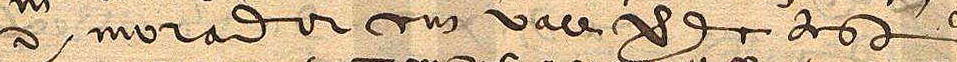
e morador em vall ꝟde testa
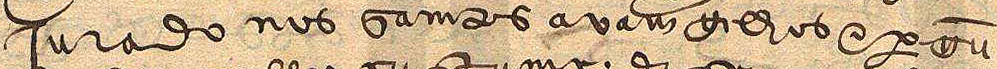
Jurado nos samtos avamgelhos e ꝑeḡu
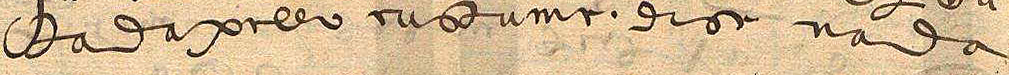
tada pello custume . dise nada
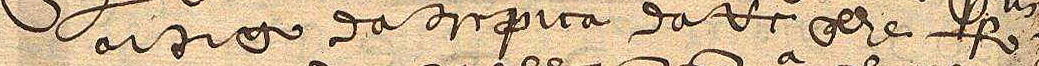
artigo da trepica da Re q̄ lhe foy
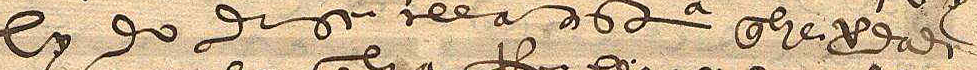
lydo dise ella testa q̄ he ꝟdade
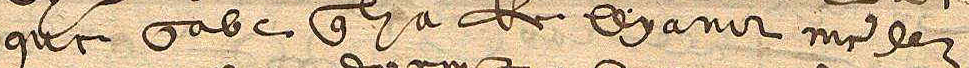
que sabe q̄ ha Re llyanor mēdez
